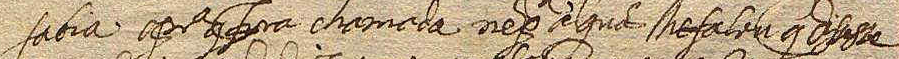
sabia o pra q̄ fora chamada nē pa alguā lhe falou q̄ dissesse
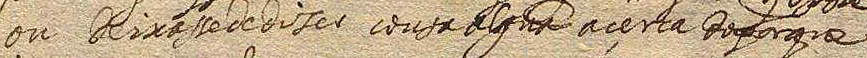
ou deixasse de dizer cousa alguā açerca do porque
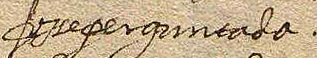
fosse perguntada.
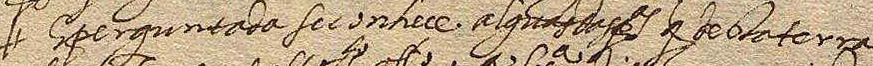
item E perguntada se conheçe alguās das pas q̄ desta terra
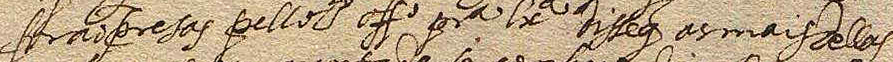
foraõ presas pello sto offo pra lxa disse q̄ as mais dellas
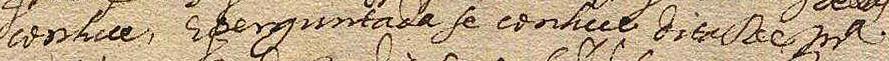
conheçe, E perguntada se conheçe dita Ree ma
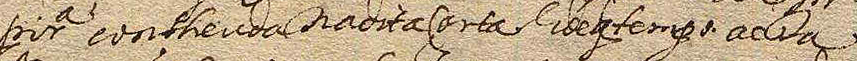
pira contheuda na dita Carta. E de q̄ tempo. a esta
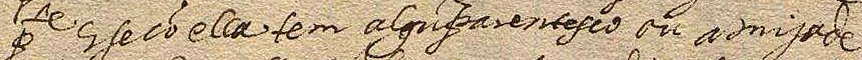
pte E se cō ella tem algū parentesco ou amisade
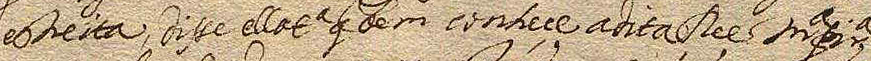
estreita, disse ella ta q̄ bem conheçe a dita Ree ma pira
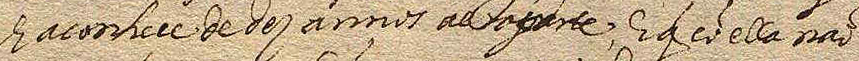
E a conheçe de des annos a esta parte, E q̄ cō ella naõ
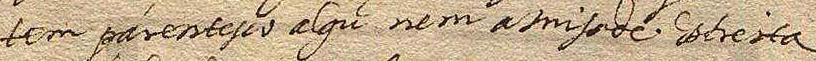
tem parentesco algū nem amisade. Estreita
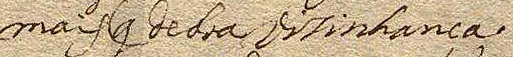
mais q̄ de boa vizinhança
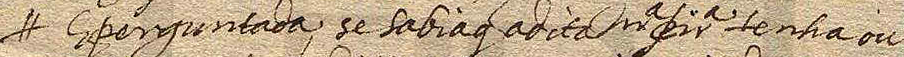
item E perguntada se sabia q̄ a dita ma pira tenha ou
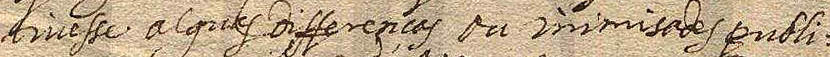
tiuesse alguās differenças ou inimisades publi
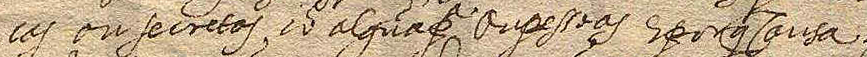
cas ou secretas cō algūa pa ou pessoas E por q̄ Causa
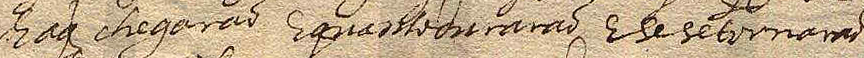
E a q̄ chegaraõ E quanto duraraõ E se se tornaraõ
